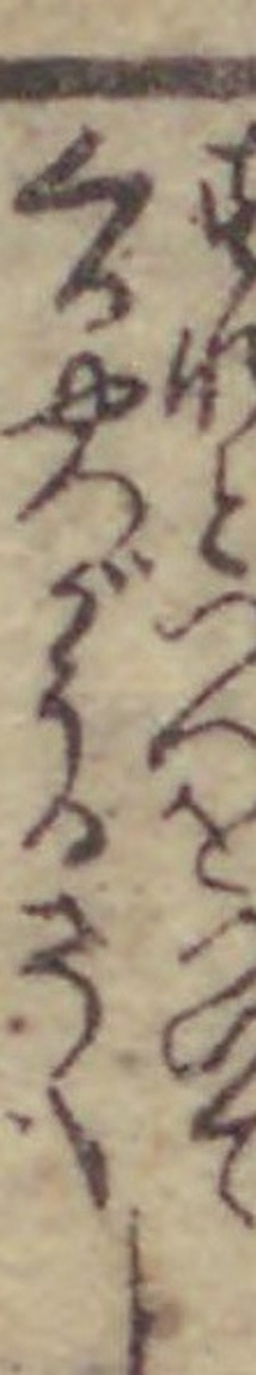くるやつがうるさく
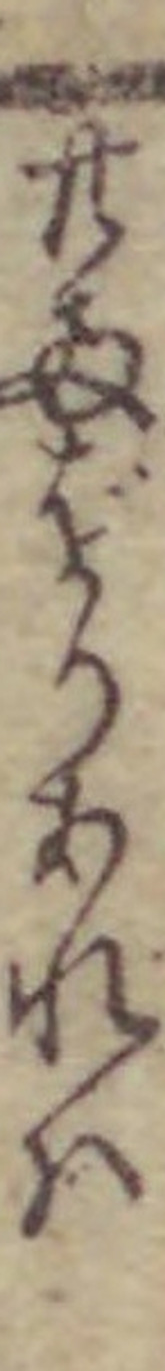廿両ばかりあれは
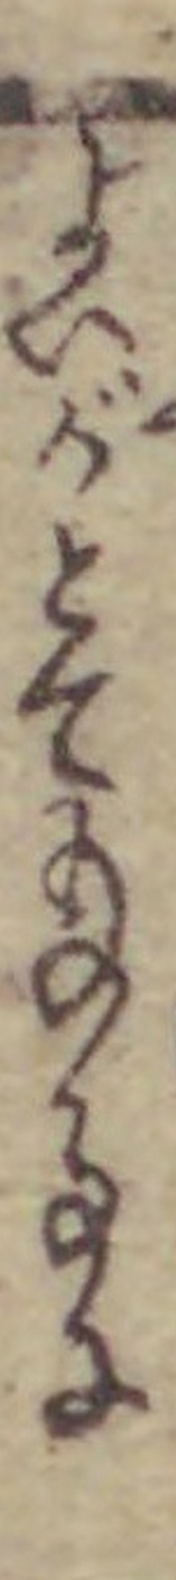よいがとてもの事に
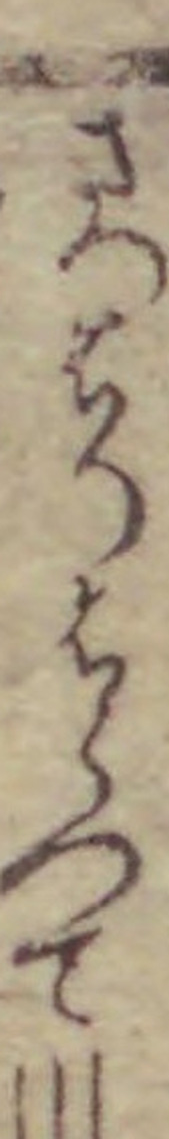さつはりはらつて
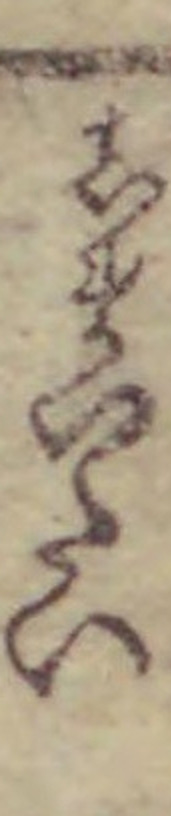しまいたい
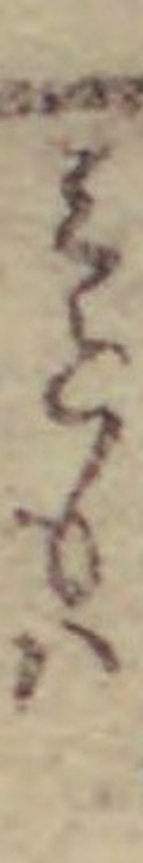みともは
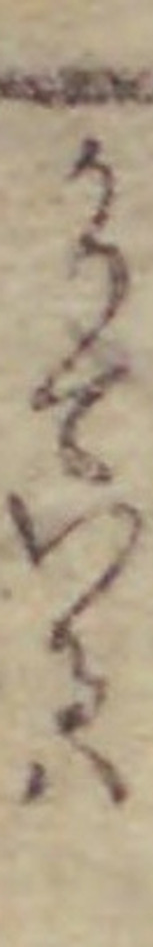かりているは
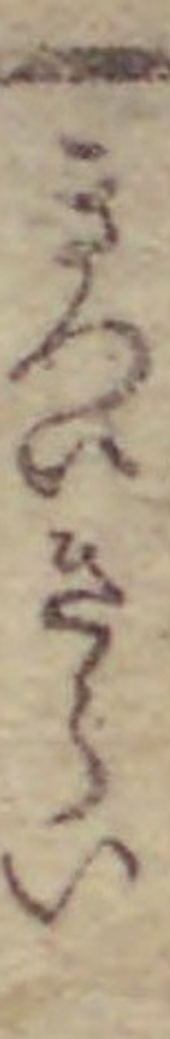きついきらい
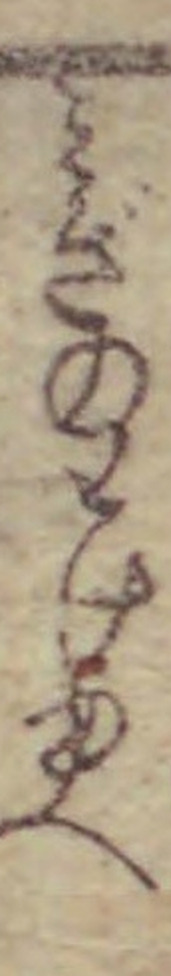みぎのわけゆへ
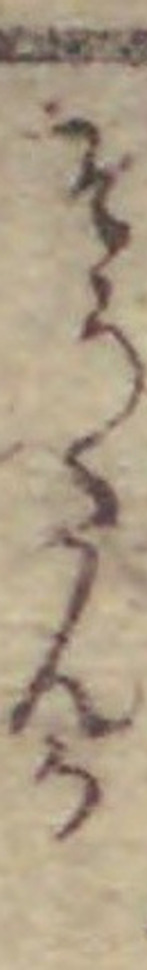そうたんか

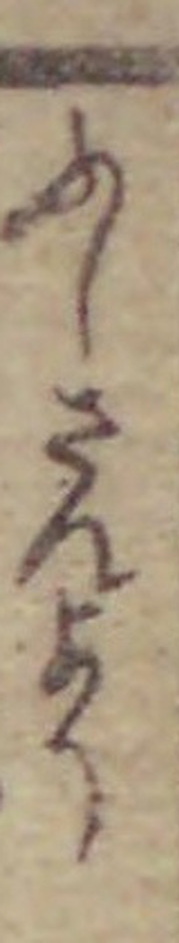ふしさんより
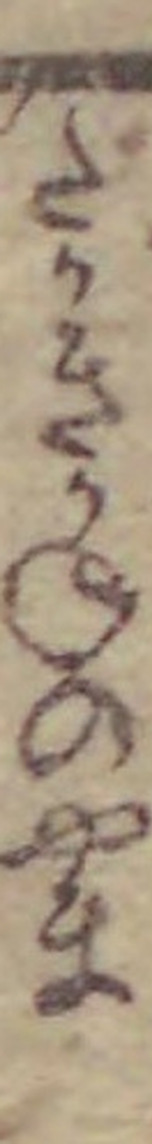たかきかねのやま
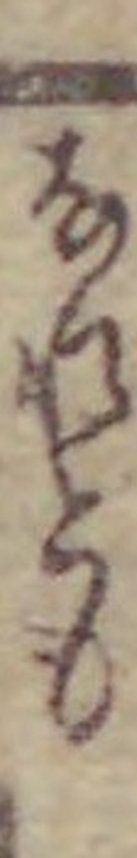なれとも
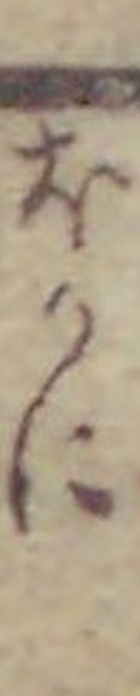ほかに
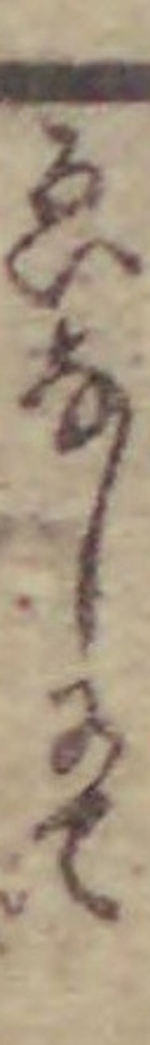るいなしにて
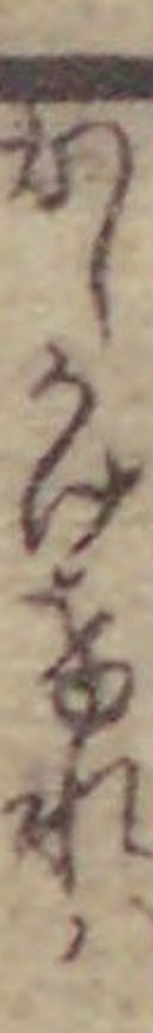かしかけければ
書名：御代の御寶
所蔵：国立国会図書館 National Diet Library, JAPAN
